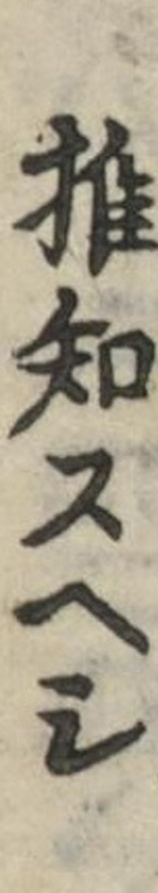推知スヘシ
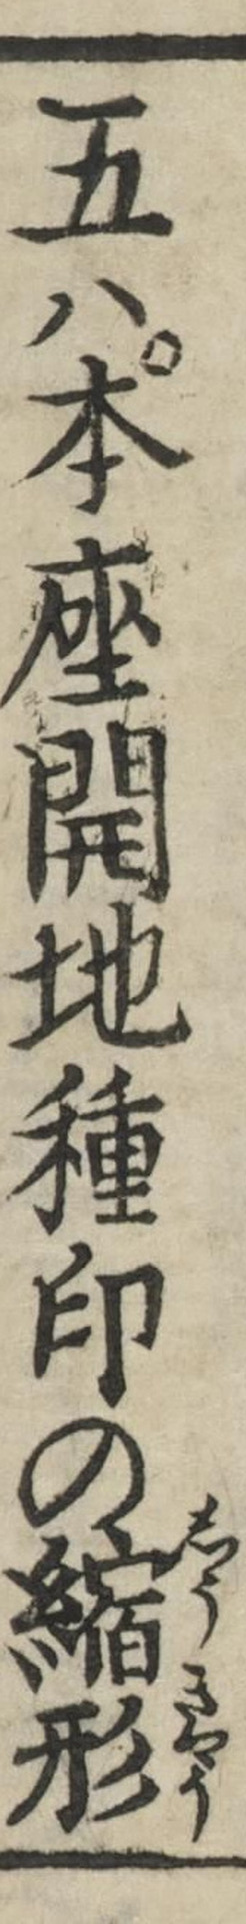五は。本座開地種印の縮形

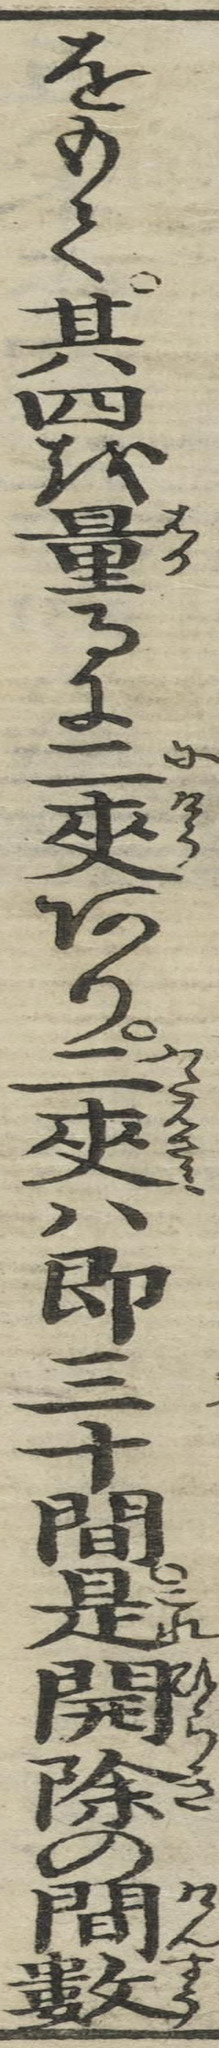をもて。其四を量るに二夾あり。二夾は即三十間。是開除の間数
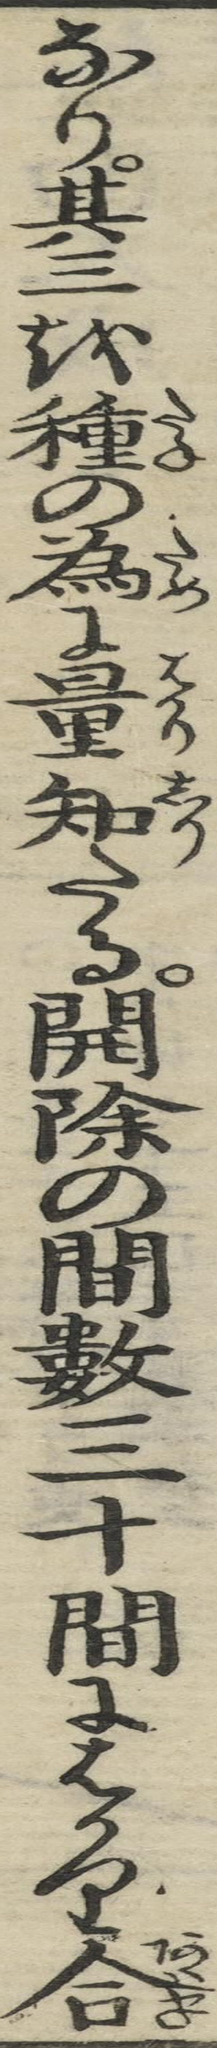なり。其三を種の為に量知たる。開除の間数三十間にはかり合。
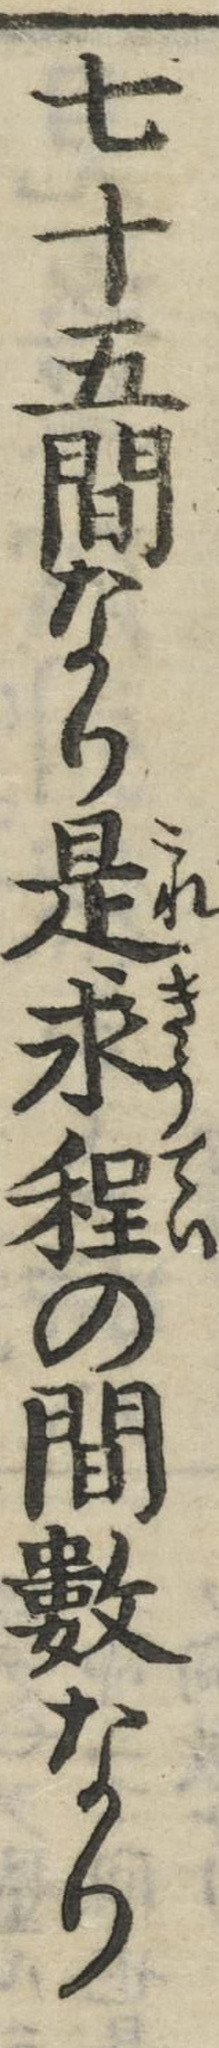七十五間なり是求程の間数なり
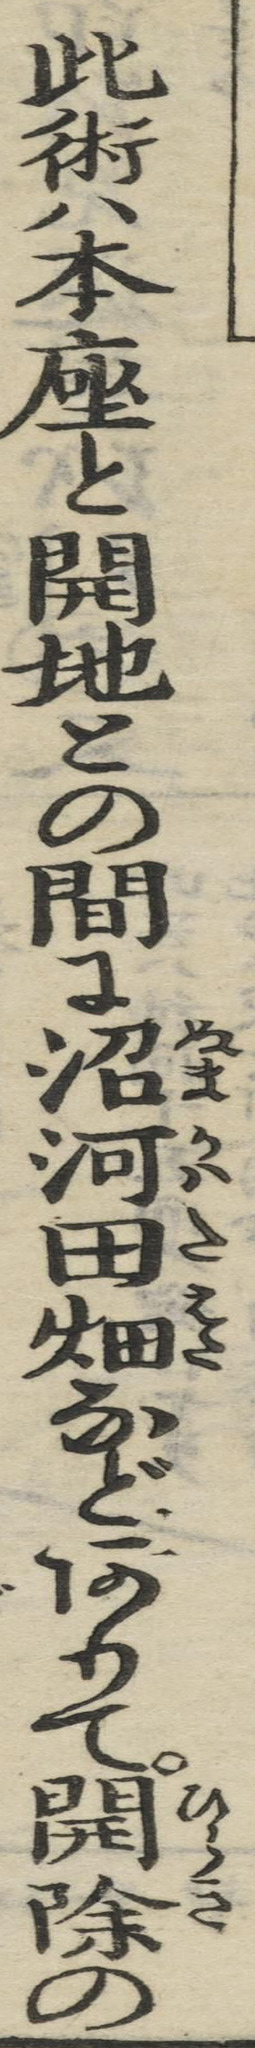此術は本座と開地との間に沼河田畑などありて。開除の
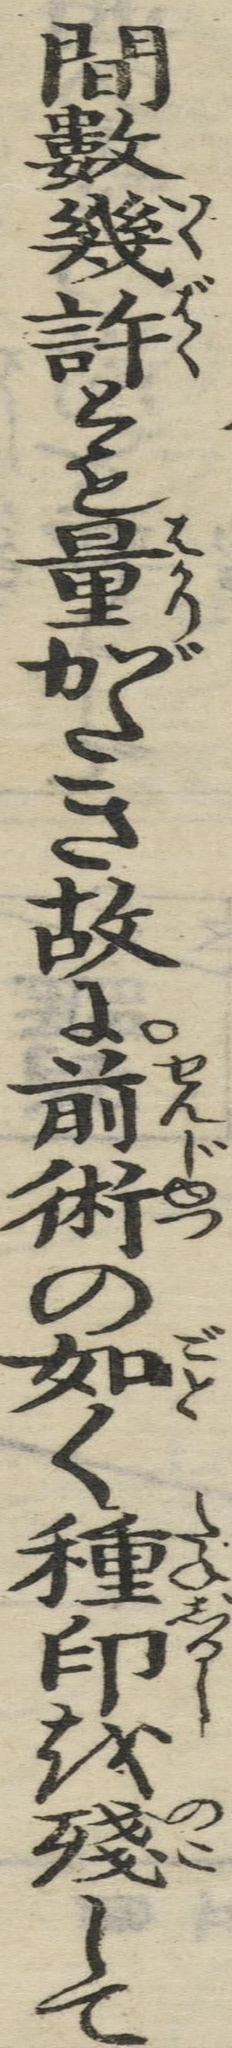間数幾許とも量がたき故に。前術の如く種印を残して
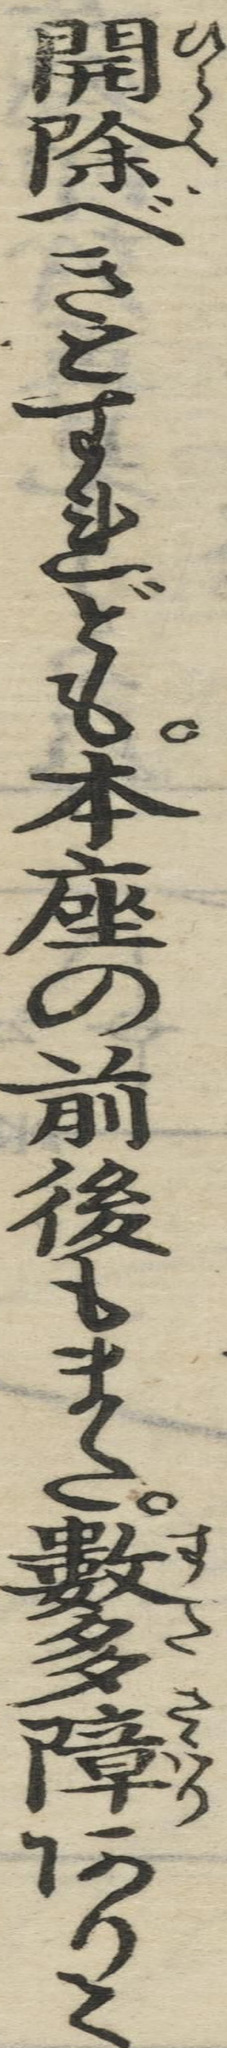開除べきとすれども。本座の前後もまた。数多障ありて
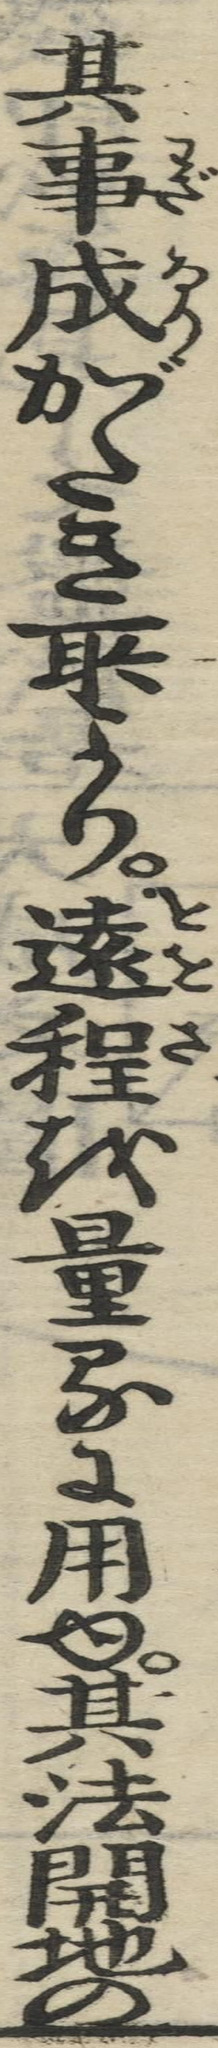其事成がたき所より。遠程を量るに用ゆ。其法開地の
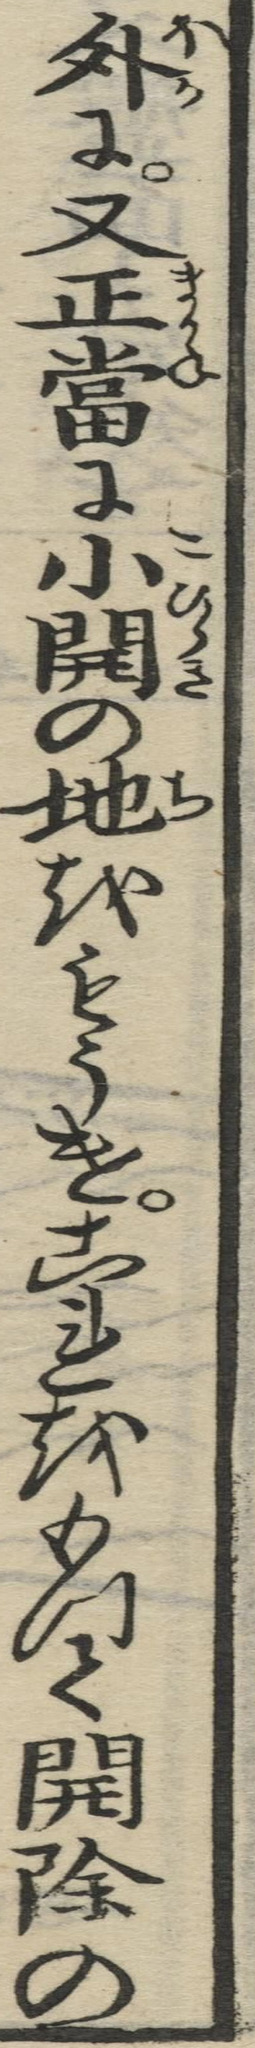外に。又正当に小開の地をもうけ。これをもつて開除の

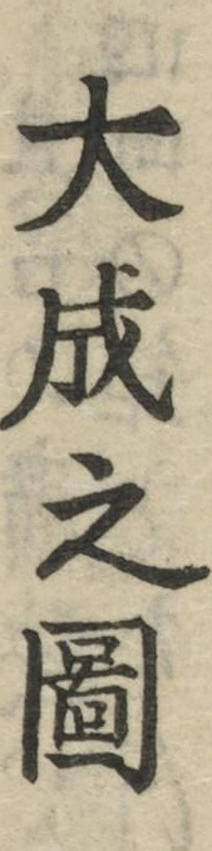大成之図

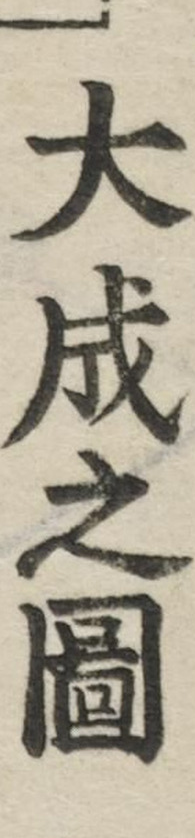大成之図
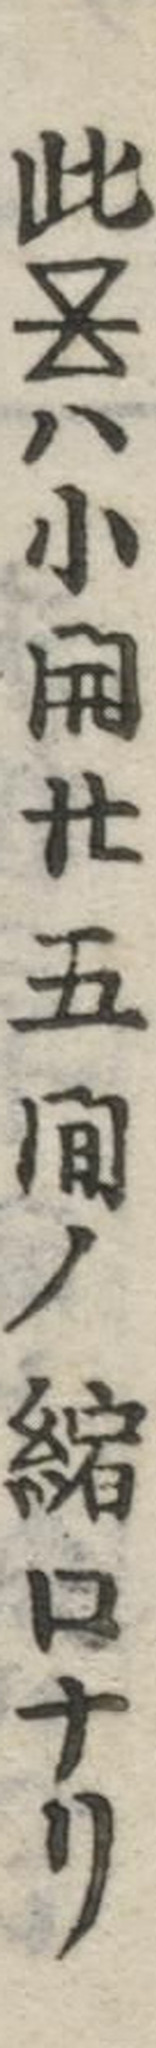此▽△ハ小開廿五間ノ縮口ナリ
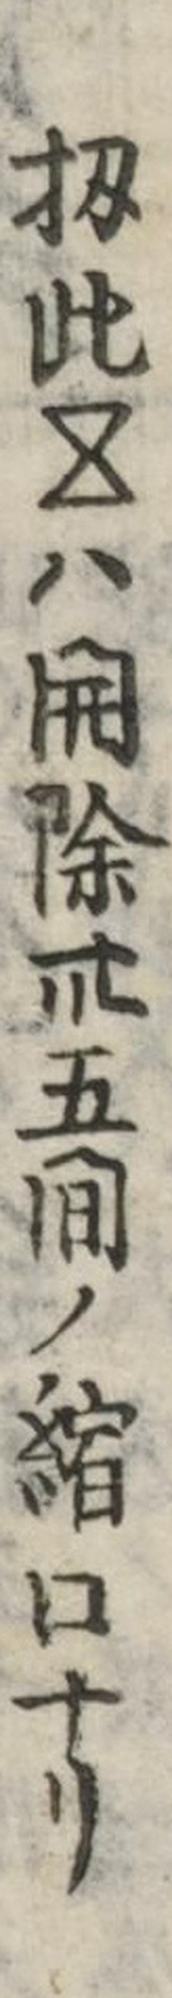此▽△ハ小開廿五間ノ縮口ナリ

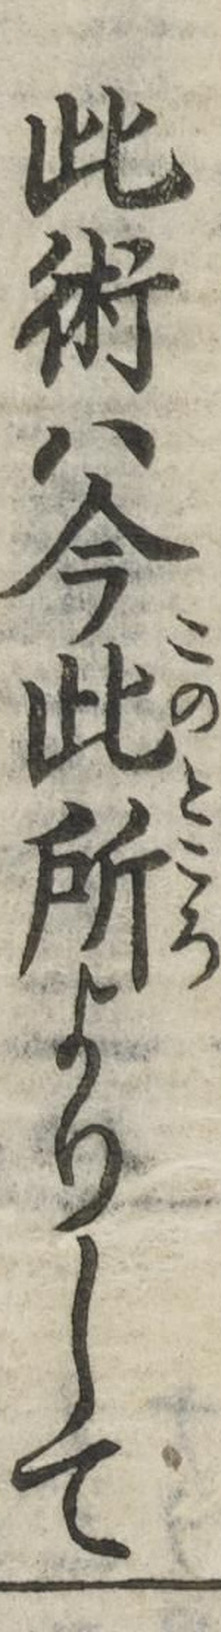此術は今此所よりして
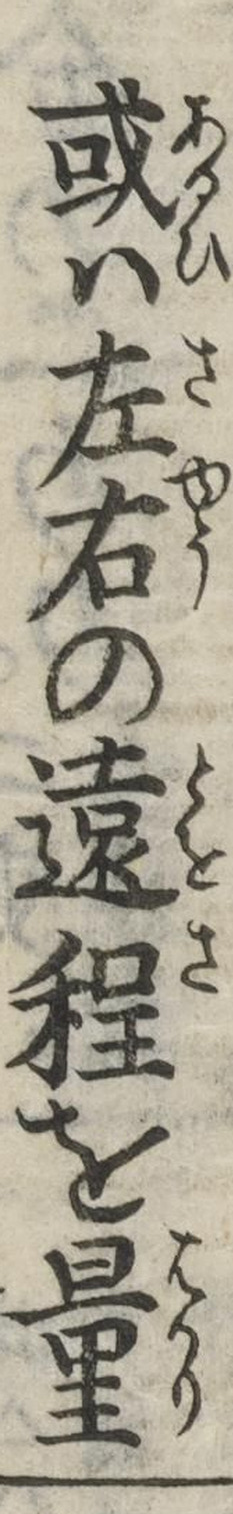或は左右の遠程を量
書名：量地指南　巻之二（内題）
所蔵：東京大学地震研究所図書室 Earthquake Research Institute Library, The University of Tokyo, JAPAN
